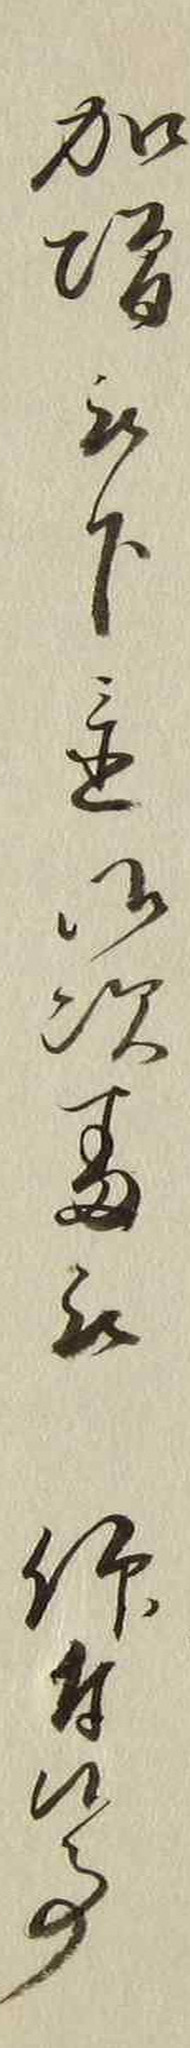加増被下置御次番被仰付候事
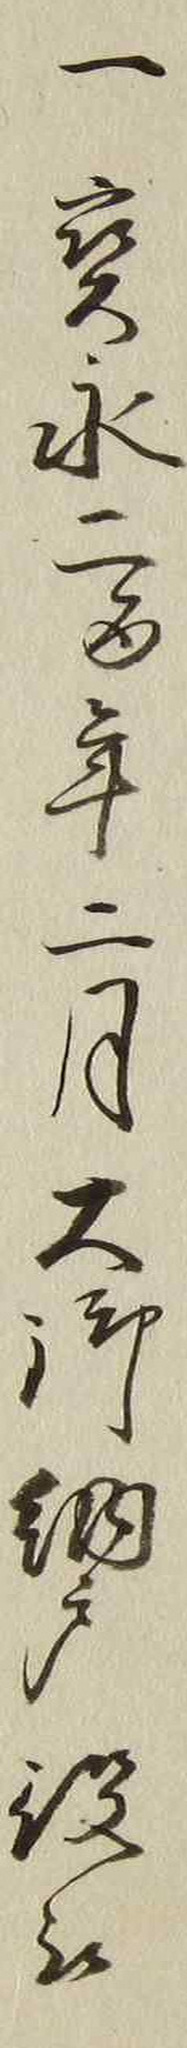一宝永二酉年二月大御納戸役被
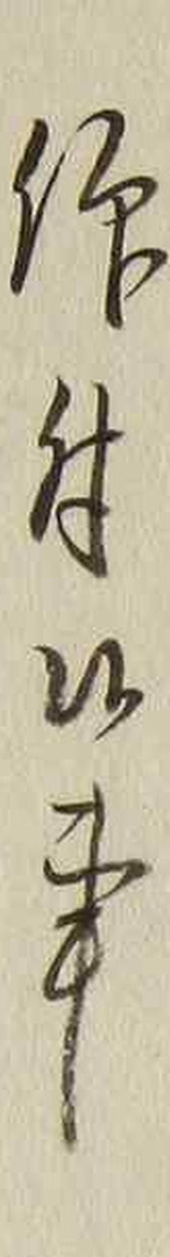仰付候事
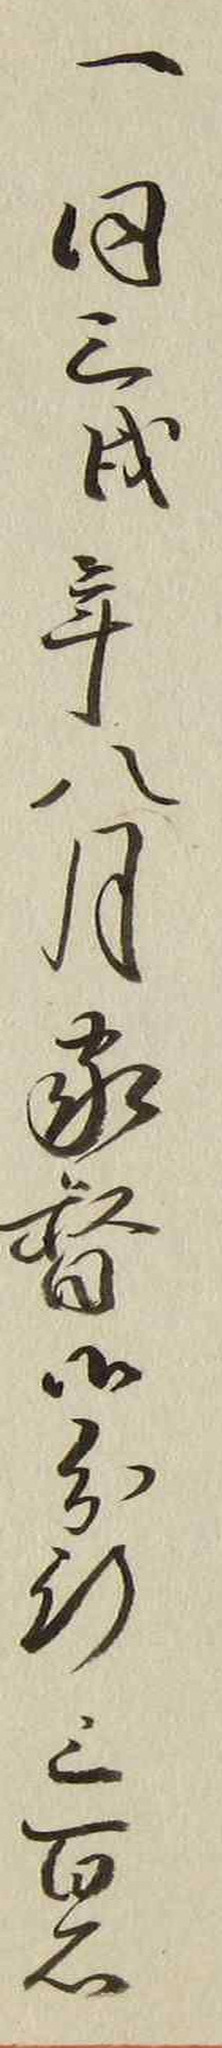一同三戌年八月家督御知行三百石
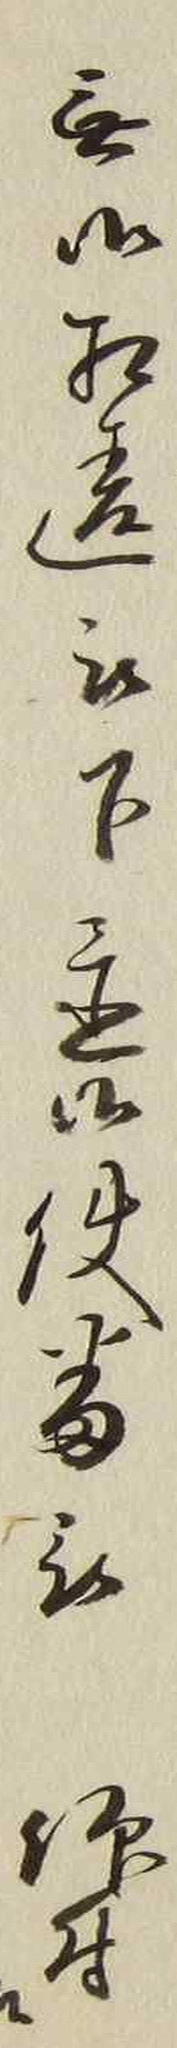無御相違被下置御使番被仰付候

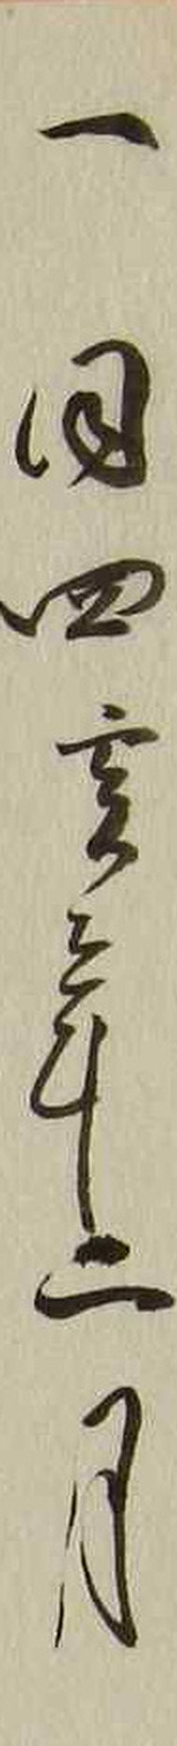一同四亥年二月
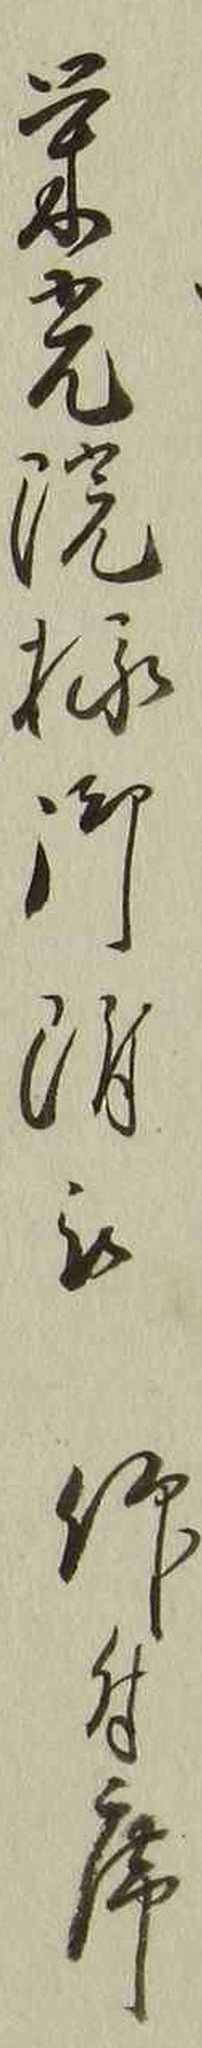栄光院様御附被仰付席
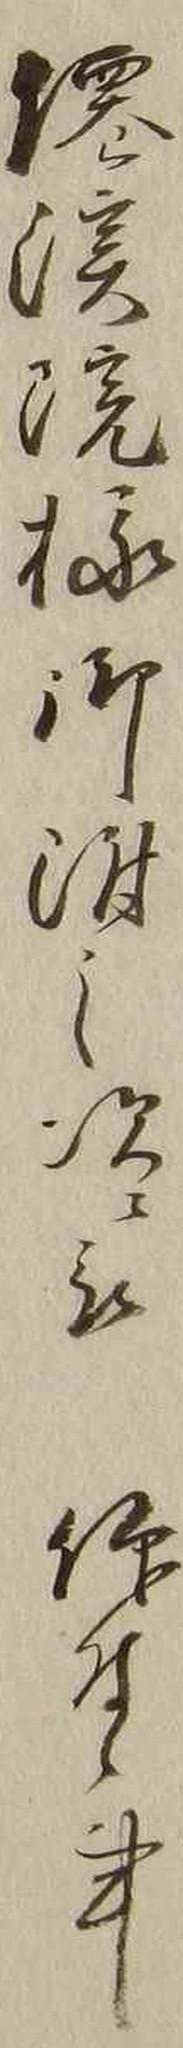仙渓院様御附之次ニ被仰付候事
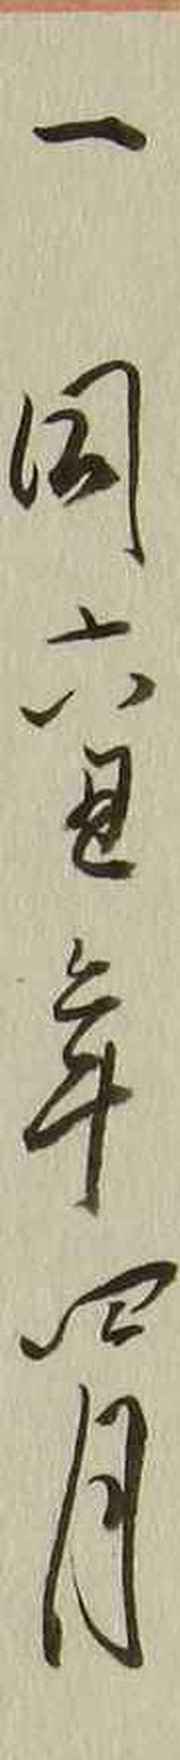一同六丑年四月
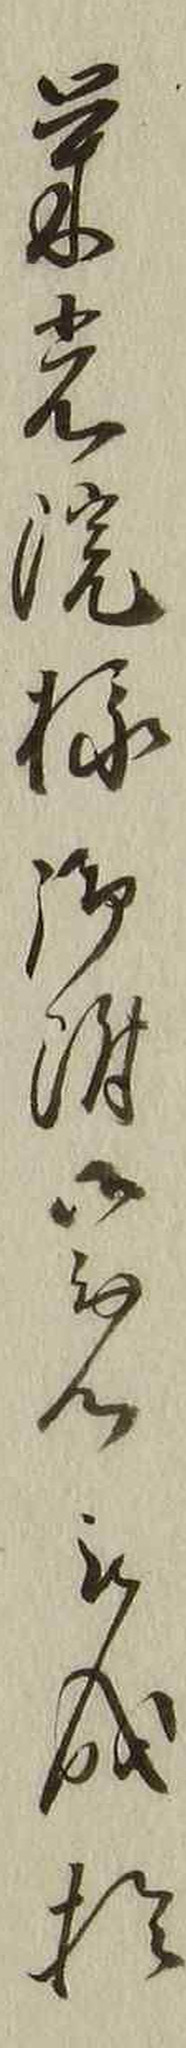栄光院様御附御免被成於
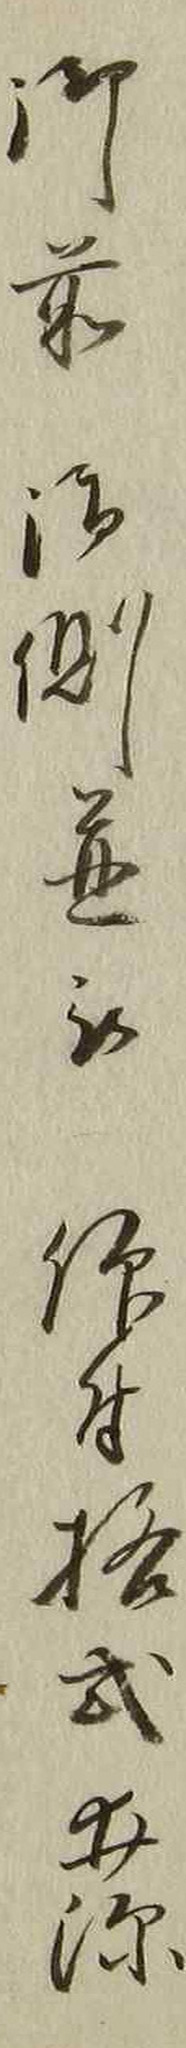御前御側並被仰付格式井深
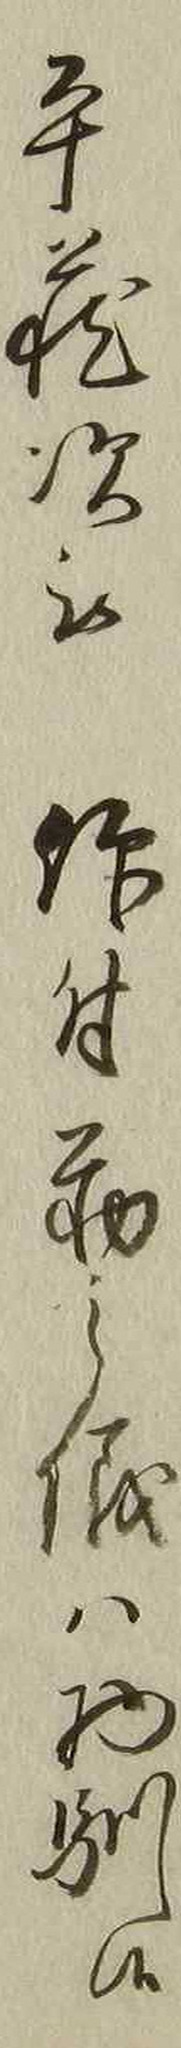平蔵次被仰付勤之儀ハ物馴候
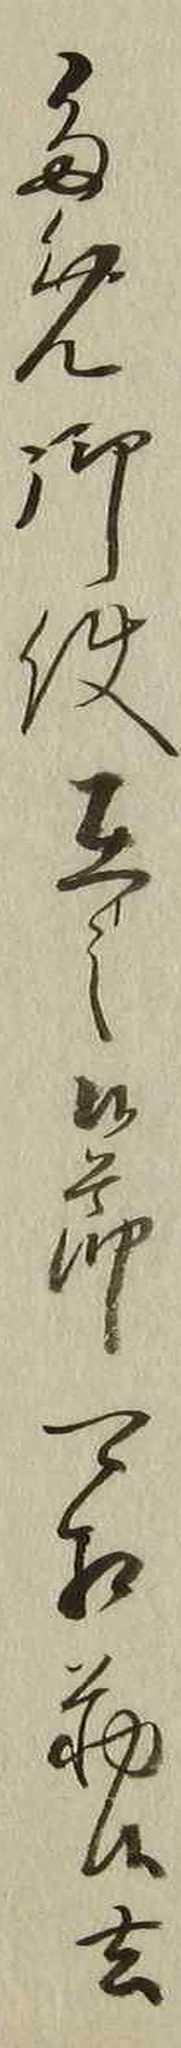ため御使在之候節可相勤候去
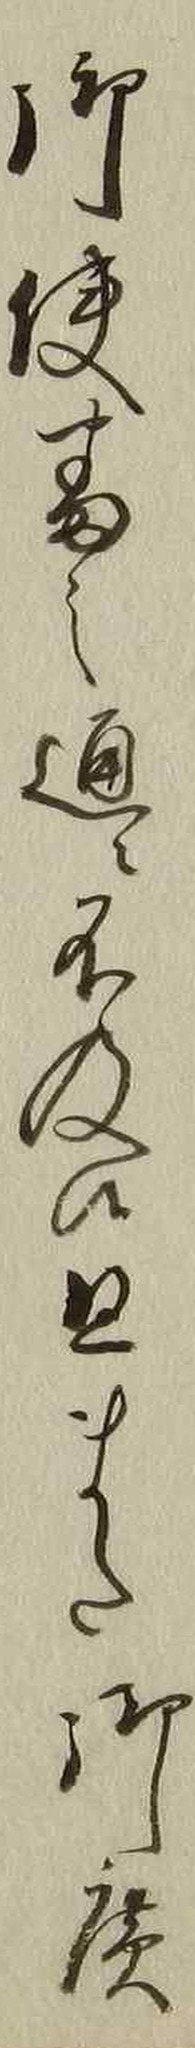御使番之通ニ不及候且また御広
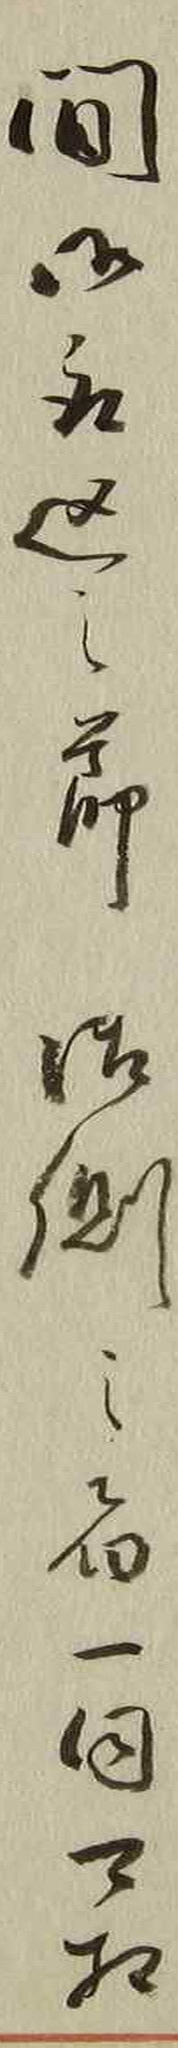間御取込之節御側之者一同可相
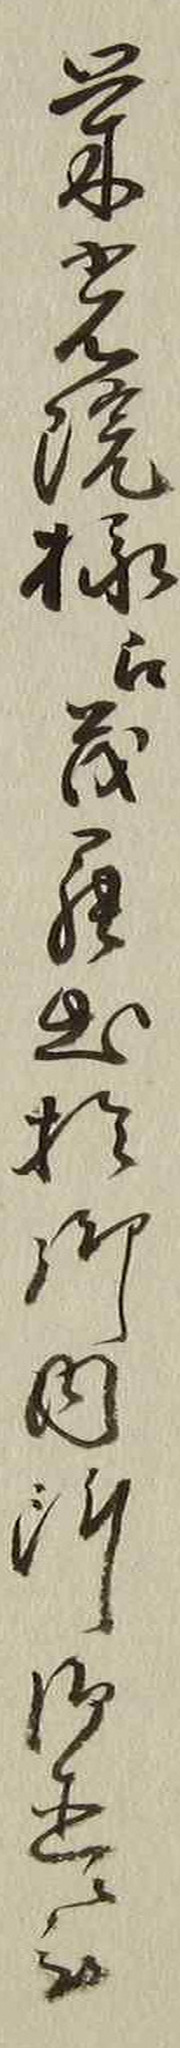栄光院様江も罷出於御内所御直ニ被
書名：諸士系譜　巻之122　よ之部5
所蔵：会津若松市立会津図書館
